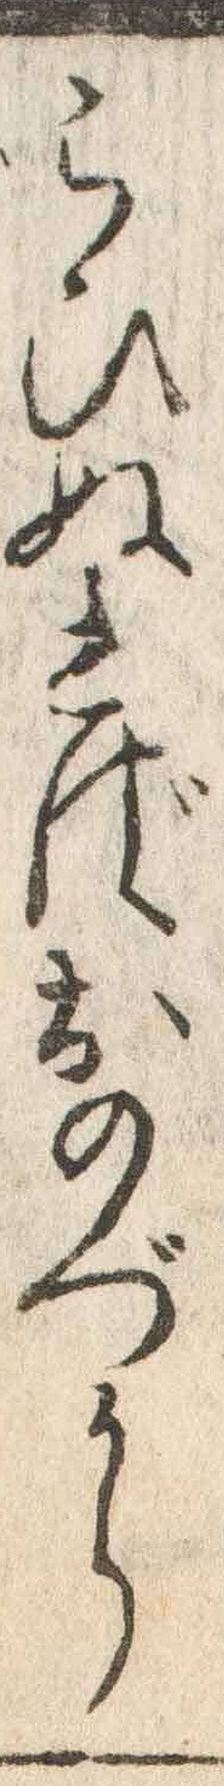らひぬればおのづから
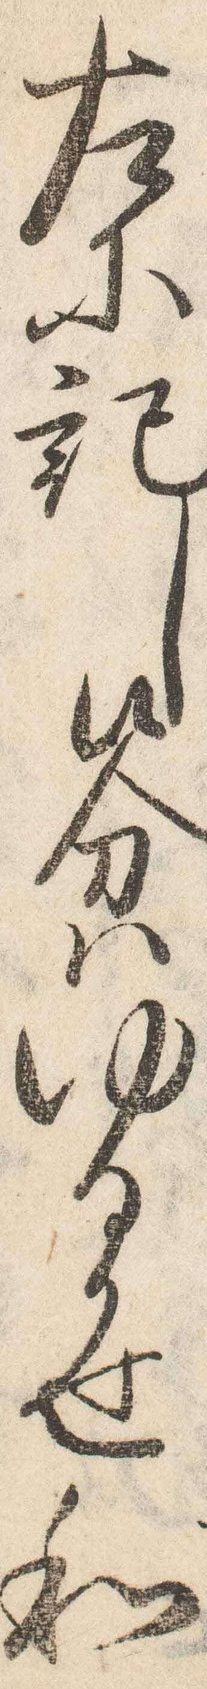左に記し候分はゆるかせ和
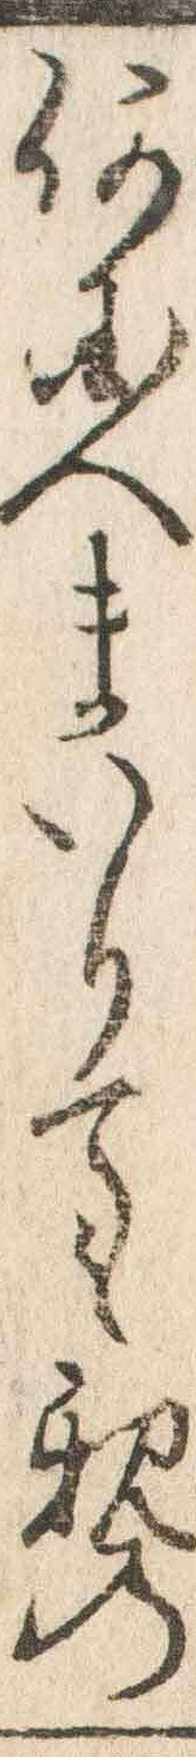何国へまいりても親の
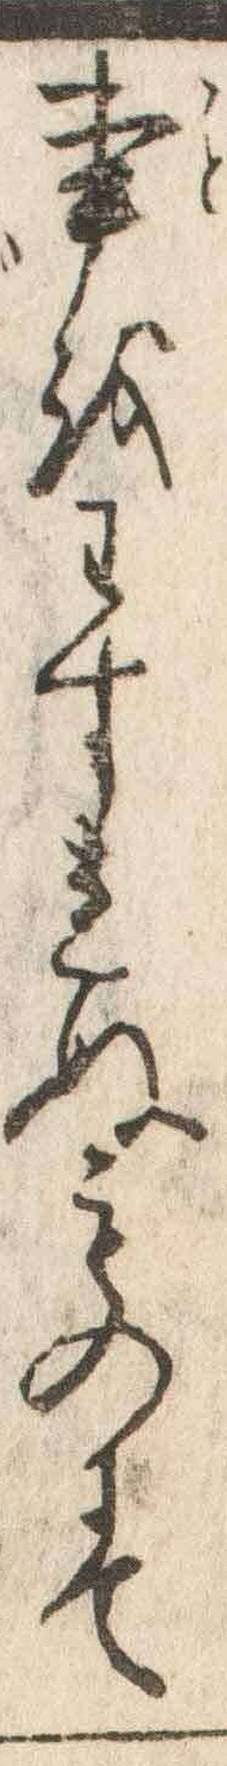事をわすれぬものにて
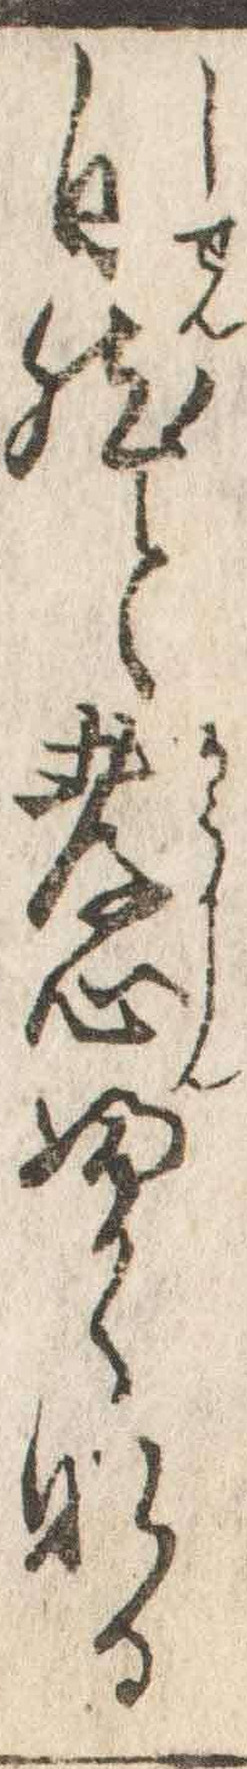自然と孝心ふかくなる
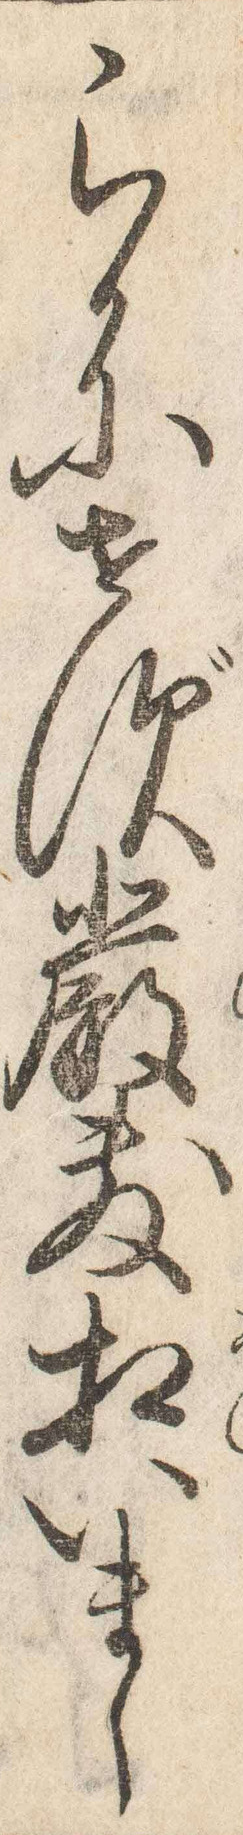らかにせず厳敷相いまし
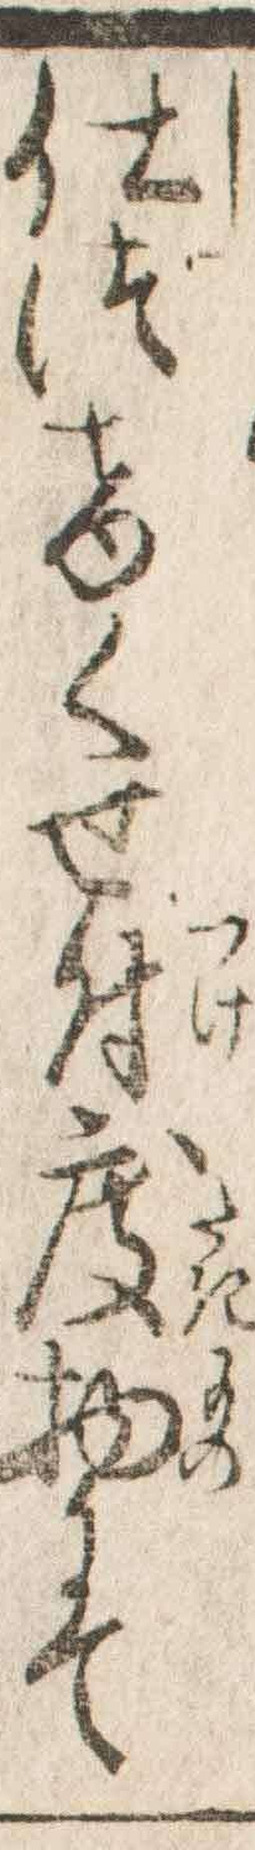仕づけくせ付度物にて
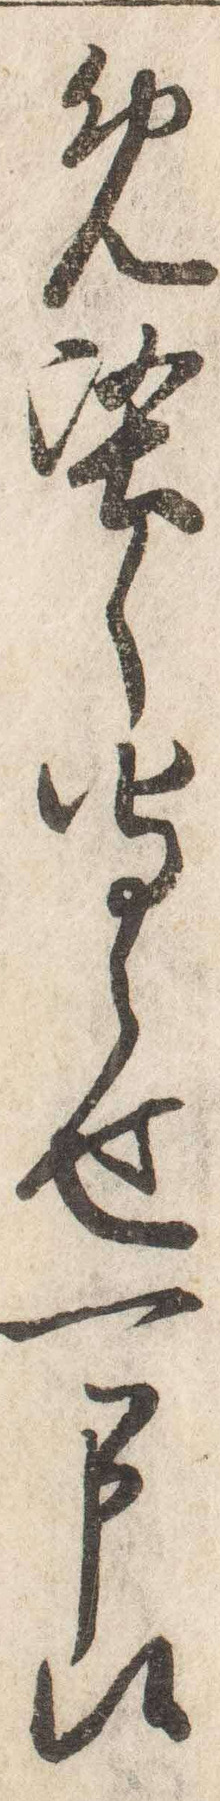め堅く守らせ可申候
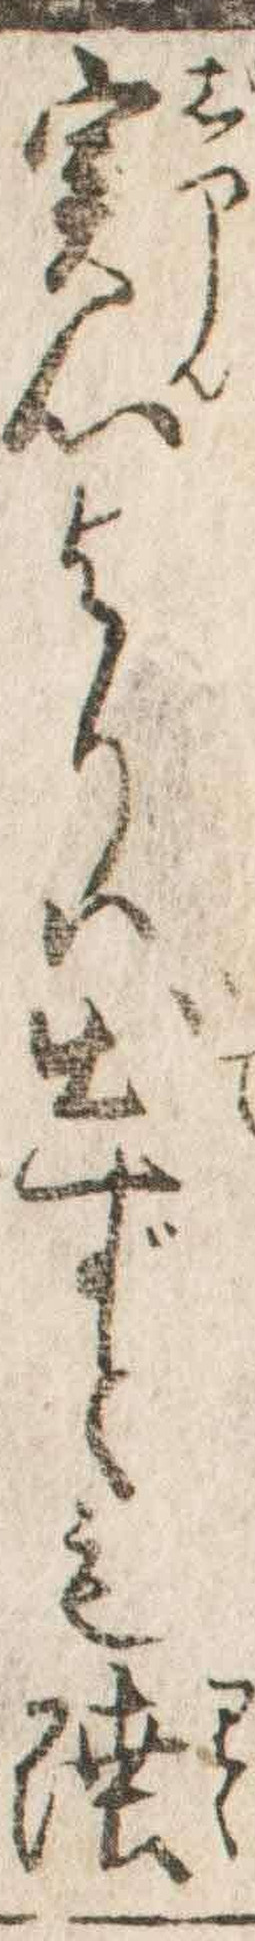実心よりは出ずとも陸
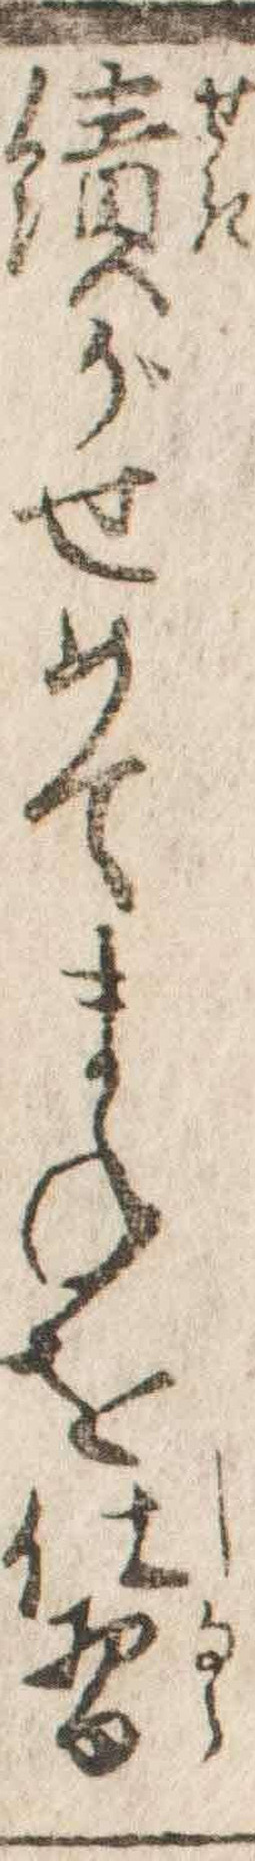績がせめてまねを仕習
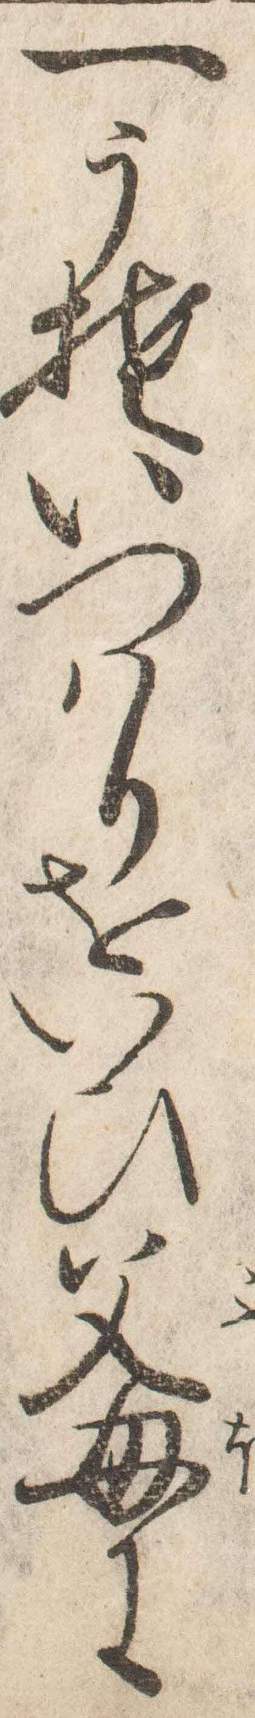一うそいつはりをいひ父母に
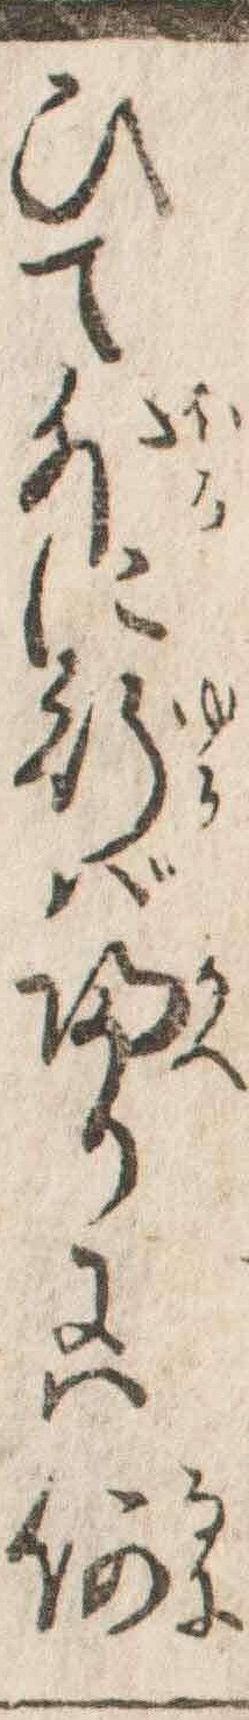ひて外に行ば帰りには何
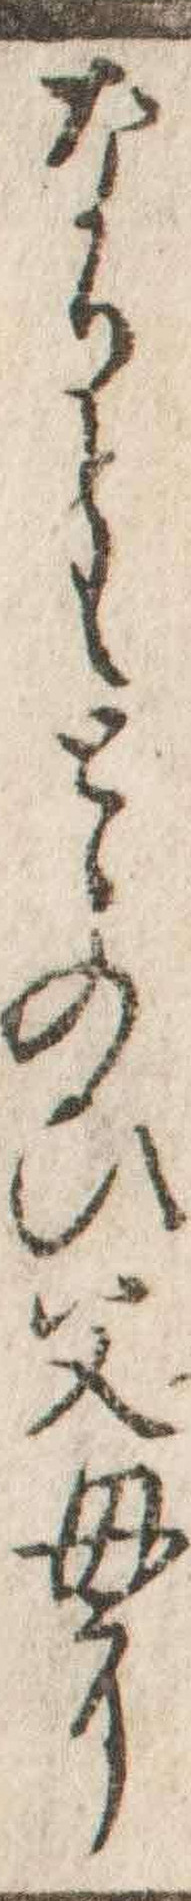なるともとゝのひ父母に
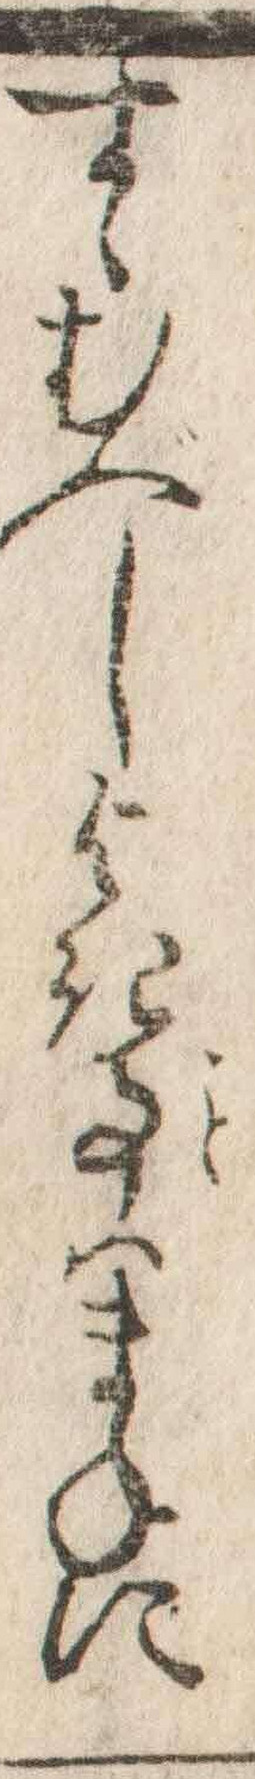すゝむべしよき事はまねに
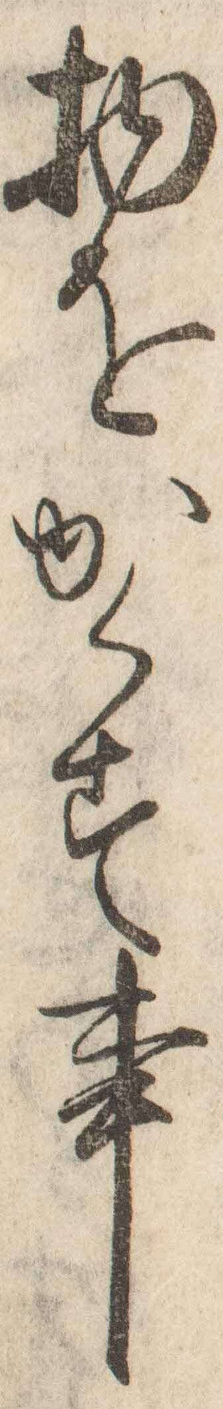物をかくす事

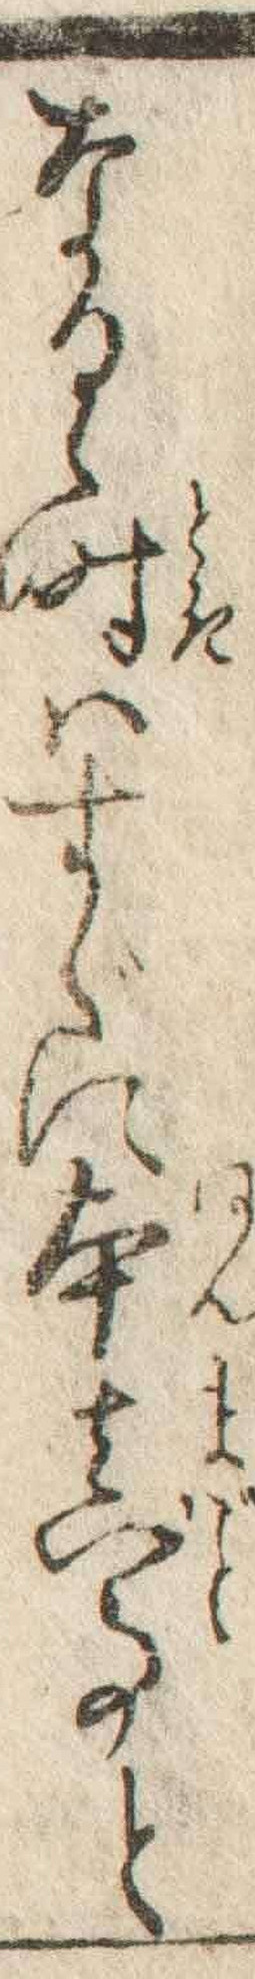なるゝ時はすぐに本真事と
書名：撫育草
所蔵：東京学芸大学附属図書館 国文学研究資料館
